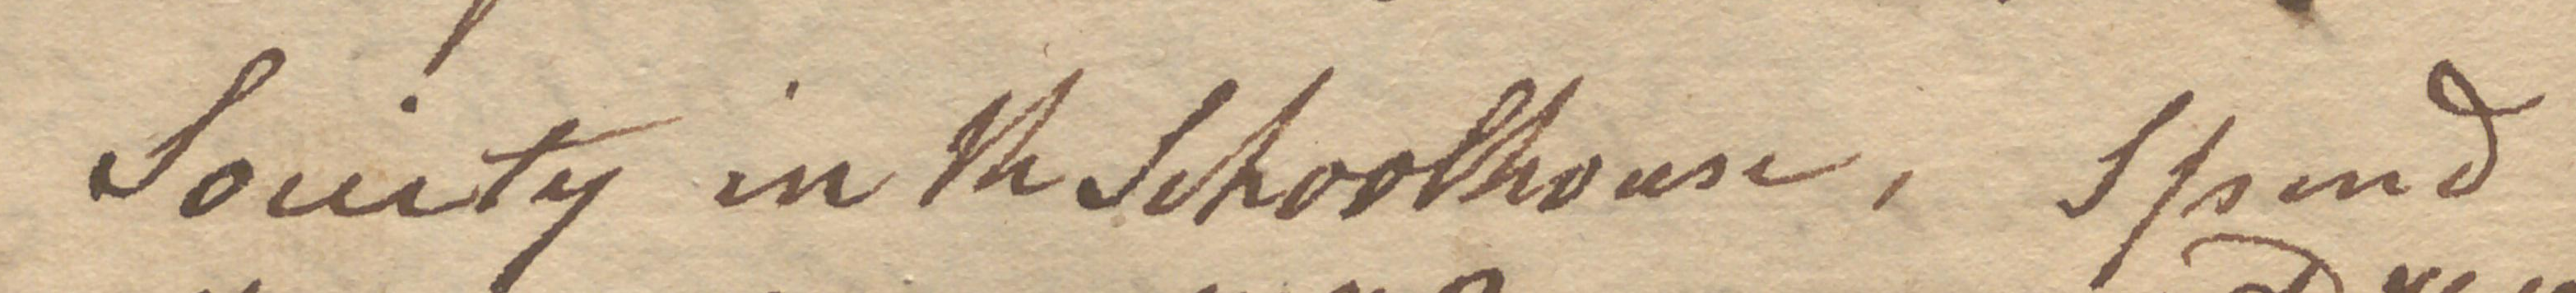Soceity in the Schoolhouse, spend
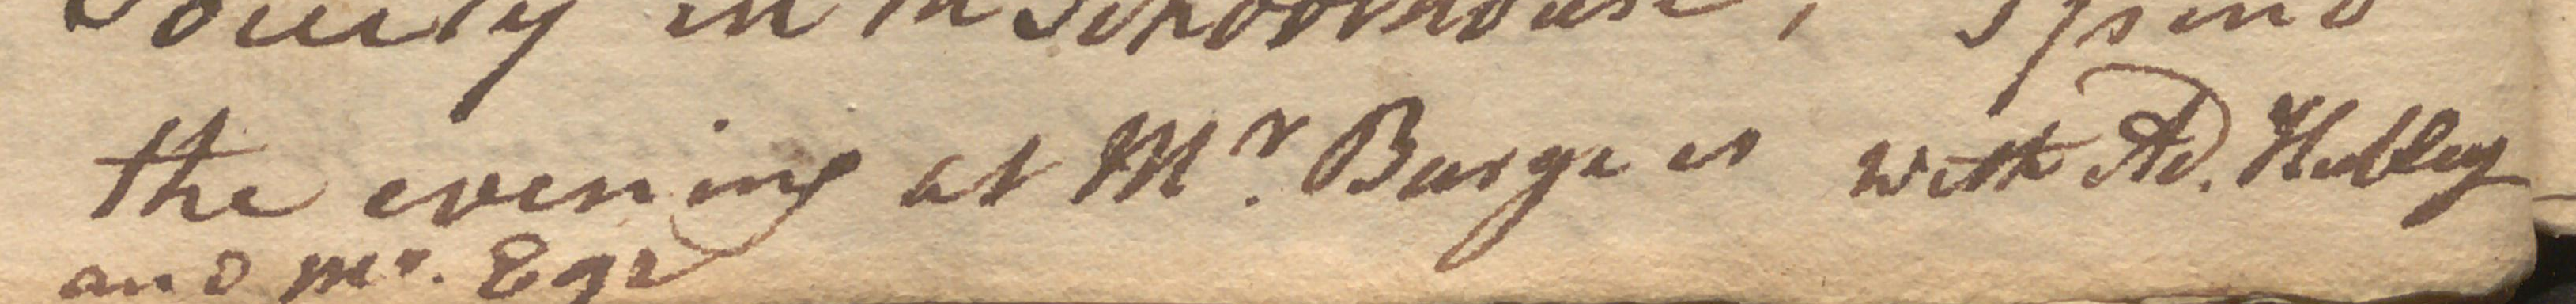the evening at M^r. Barges with Ad. Hubley
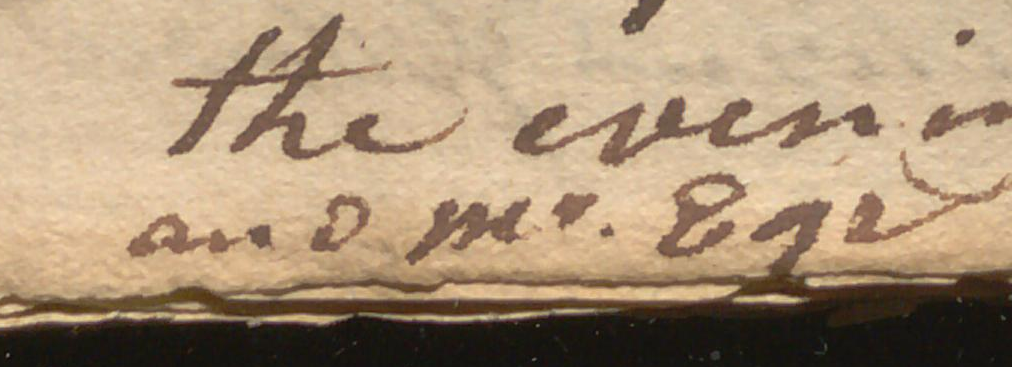and M^r. Ege
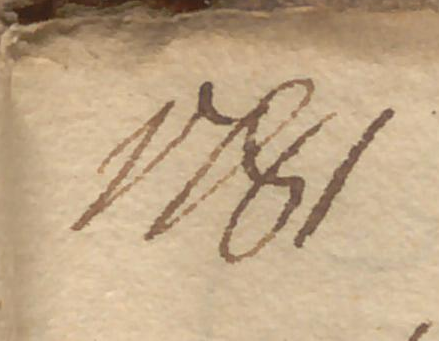1781
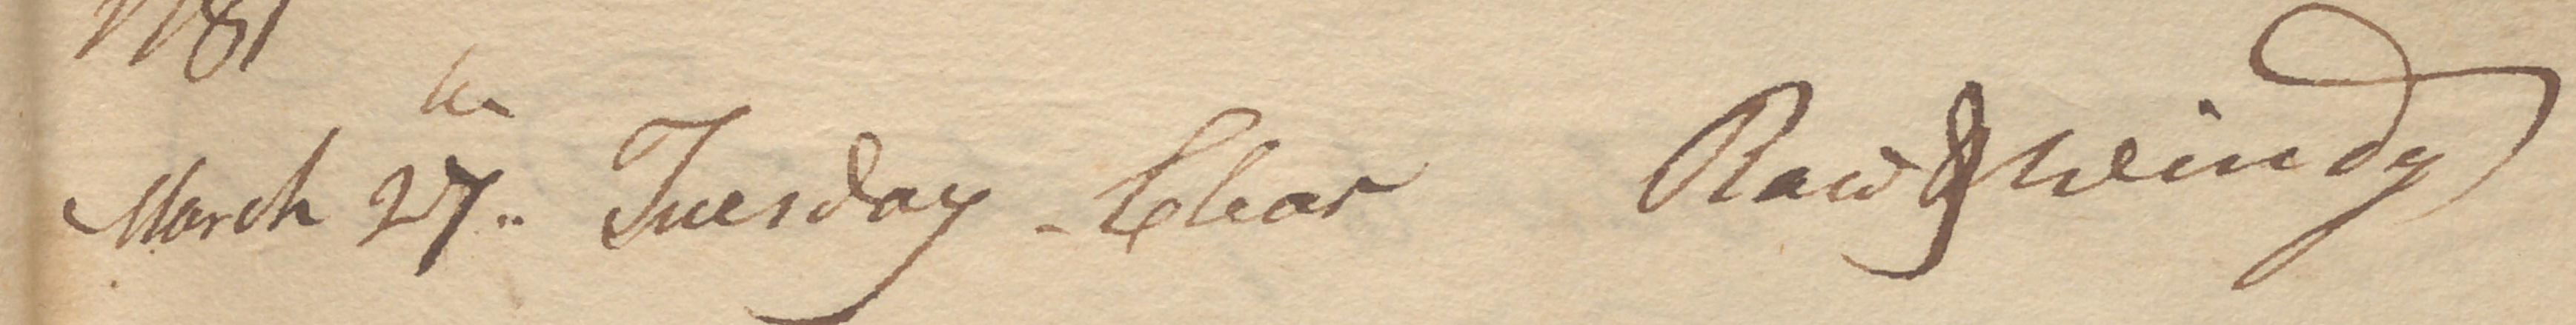March 27^th. Tuesday Clear Raw & windy,
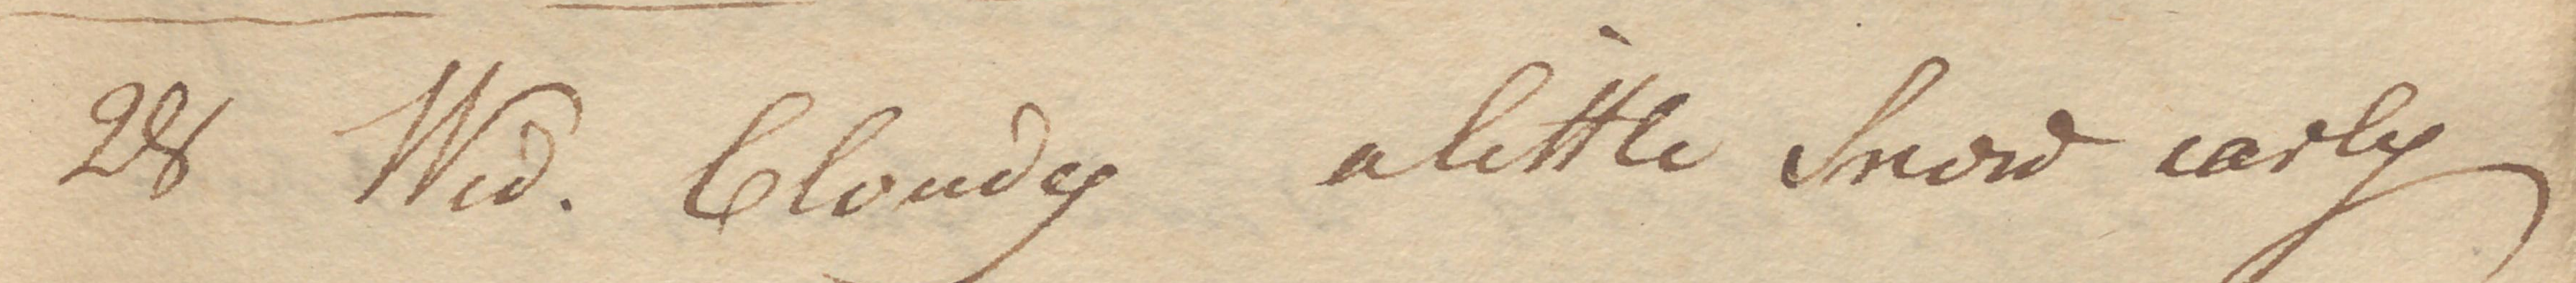28 Wed. Cloudy a little Snow early
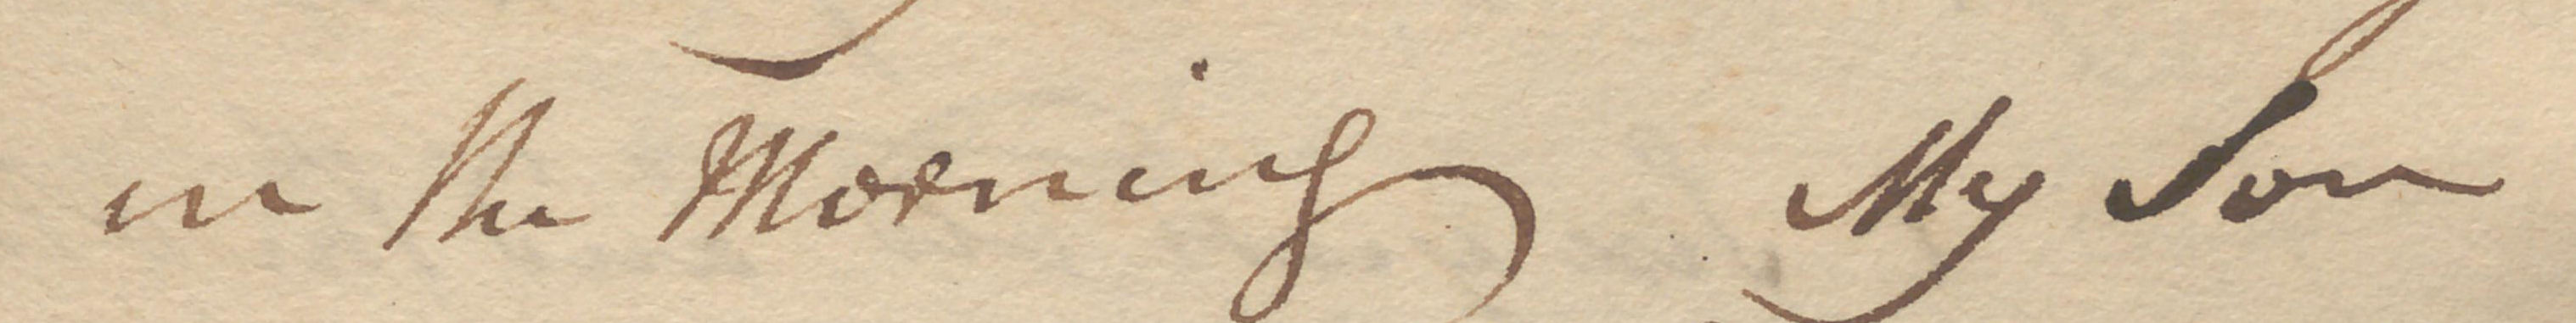in the Morning My Son
